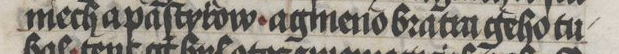niech a paſtyṙow.a gmeno bratra geho tu¬
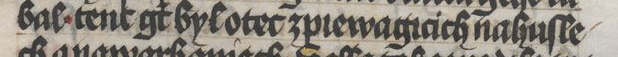bal.tent ḡt byl otec zpiewagicích nahuſle¬
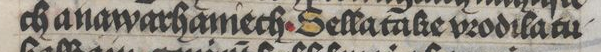ch a nawarhaniech.Sella take vrodila tu¬
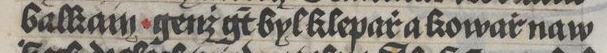balkain.genż ḡt byl klepaṙ a kowaṙ na w¬
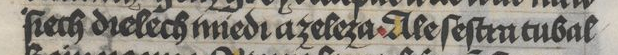ẛiech dielech míedi a zeleza.Ale ſeſtra tubal¬
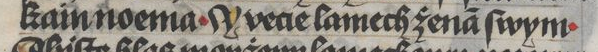kain noema. Y vecie lamech żenā ſwym.
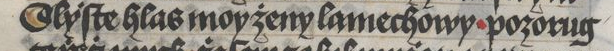Slyẛte hlas moy żeny lamechowy. pozorug¬
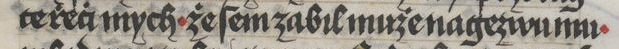te ṙeċi mych.że ſem zabil muże nagezwu mu.
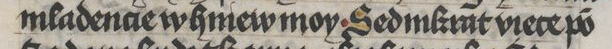mladencie w hniew moy.Sedmkrat viece pō¬
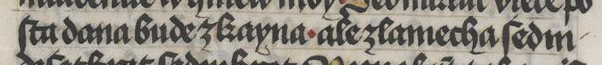ſta dana bude z kayna.ale z lamecha ſedm¬
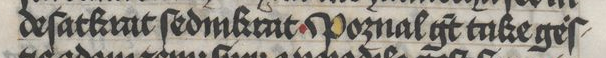deſatkrat ſedmkrat. Poznal ḡt take geẛ¬
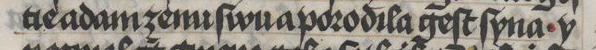tie adam zenu ſwu a porodila geſt ſyna. y
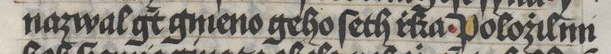nazwal ḡt gmeno geho ſeth ṙka. Polożil mi
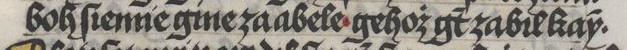boh ſiemíe gíne za abele. gehoż ḡt zabil kaȳ.
